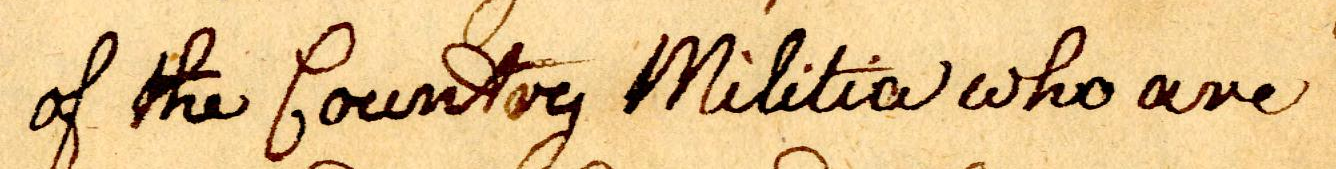of the Country Militia who are
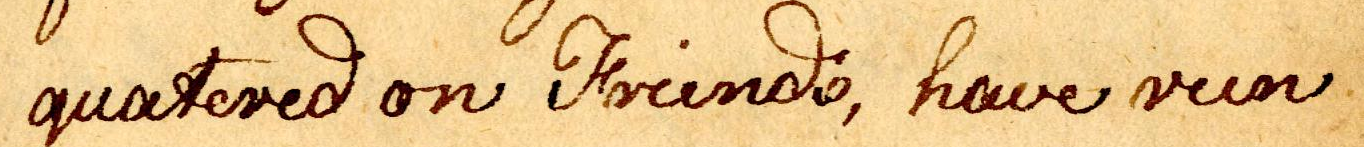quatered on Friends, have run
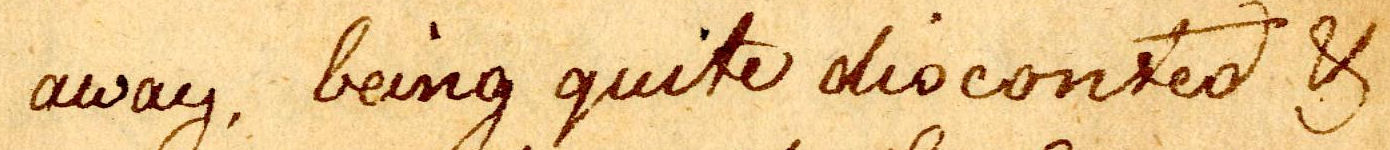away, being quite disconted &
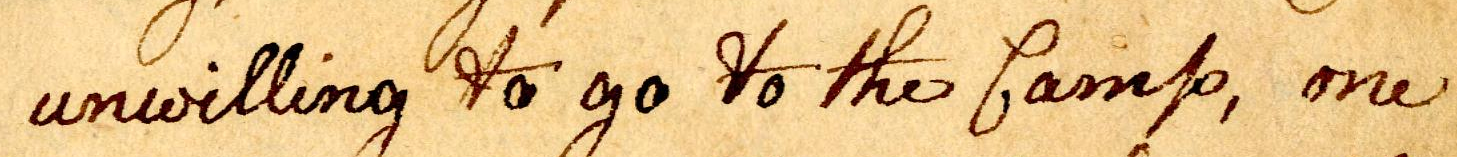unwilling to go to the Camp, one
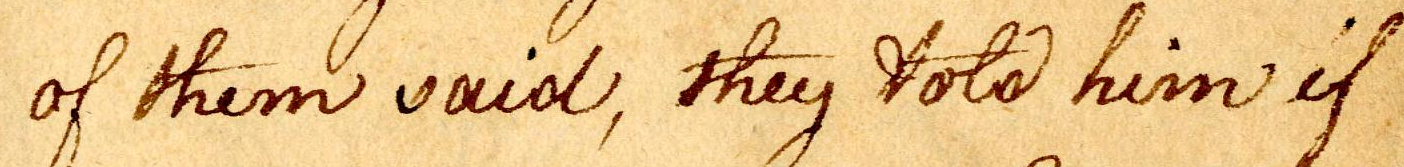of them said, they told him if
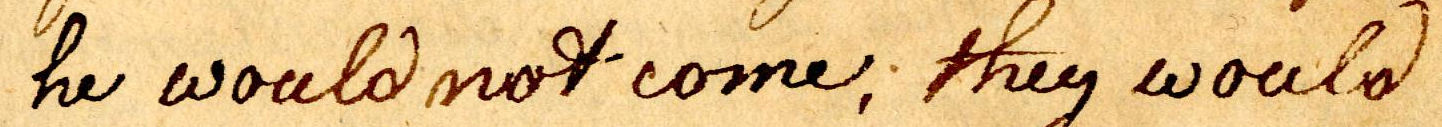he would not come, they would
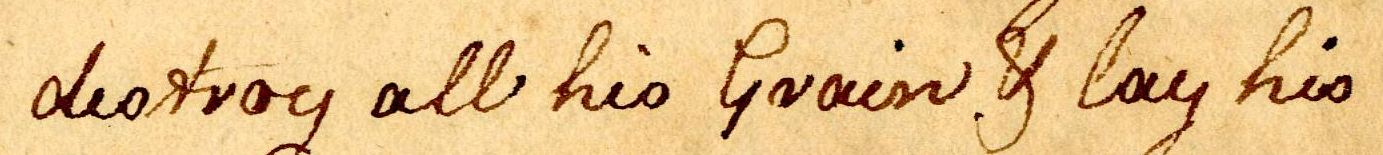destroy all his Grain & lay his
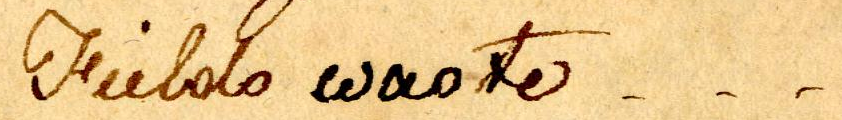Fields waste-
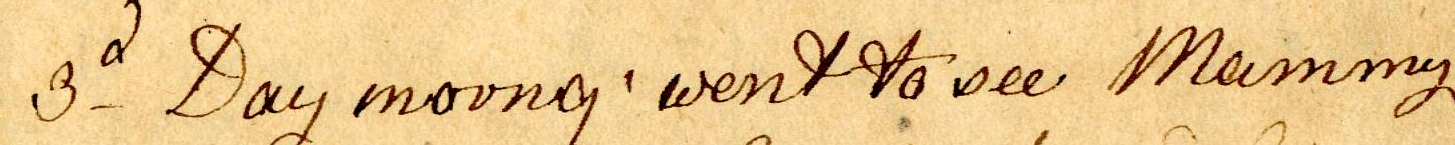3^d Day morng. went to see Mammy
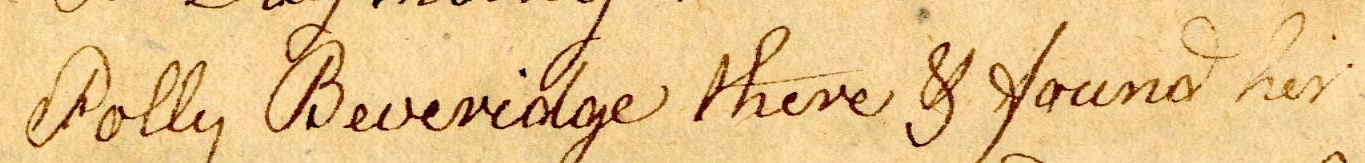Polly Beveridge there & found her
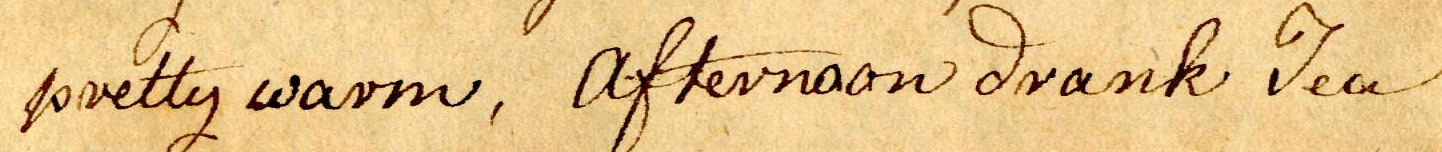pretty warm, Afternoon drank Tea
